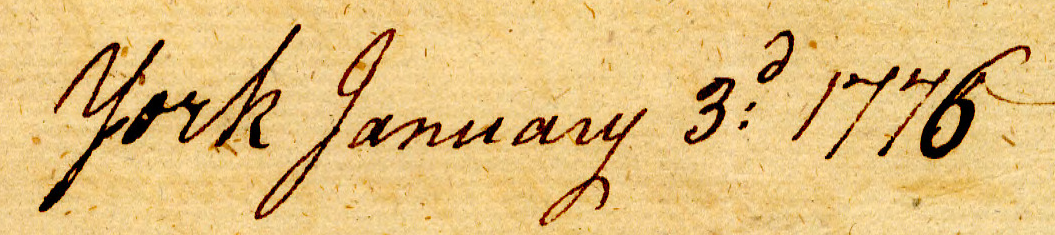York January 3^d: 1776
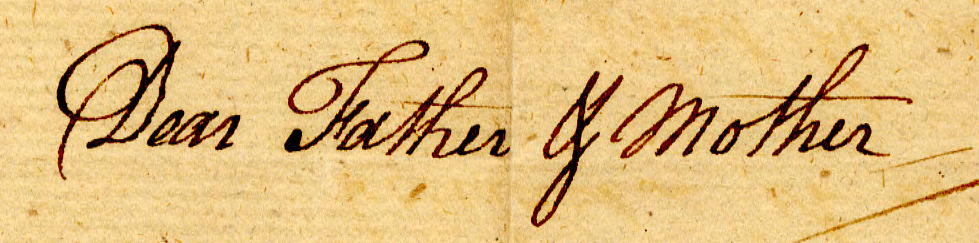Dear Father & Mother
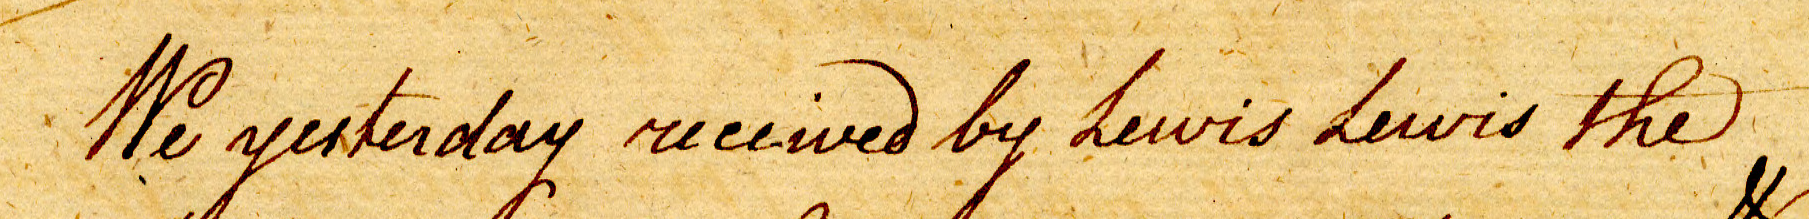We yesterday received by Lewis Lewis the
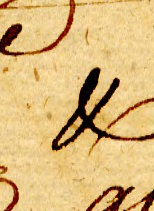&
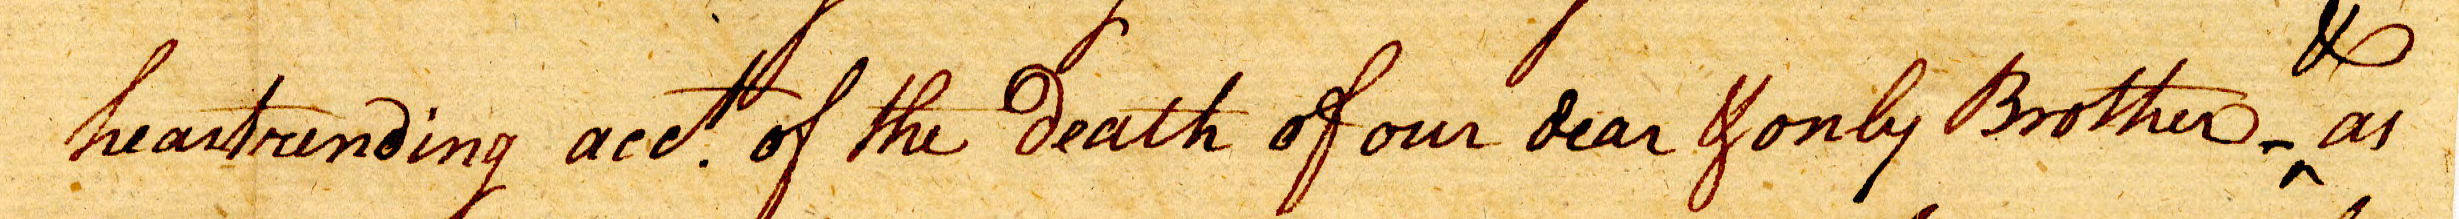heartrending acc^t. of the death of our dear & only Brother ^ as
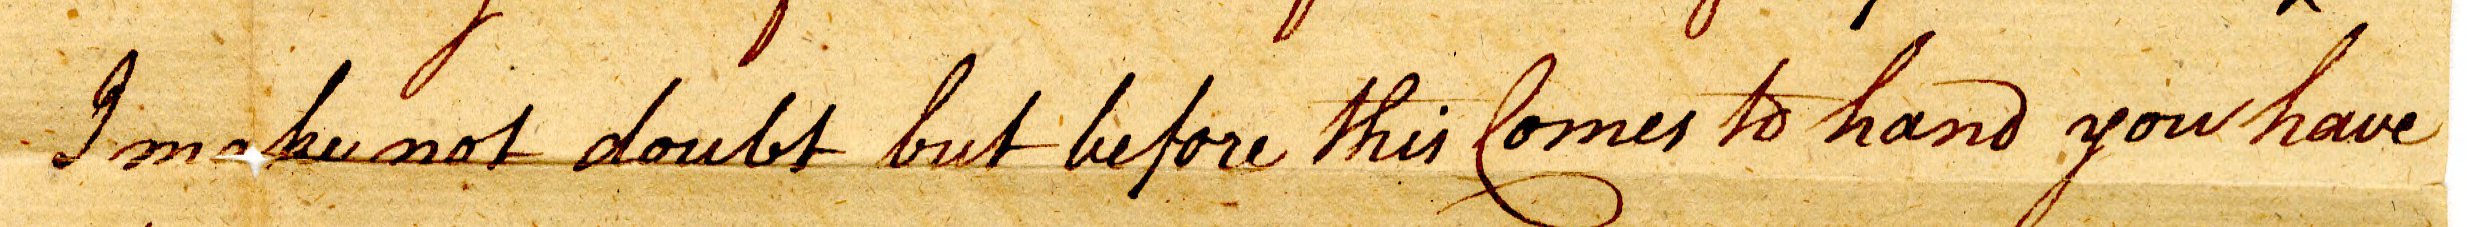I make not doubt but before this Comes to hand you have
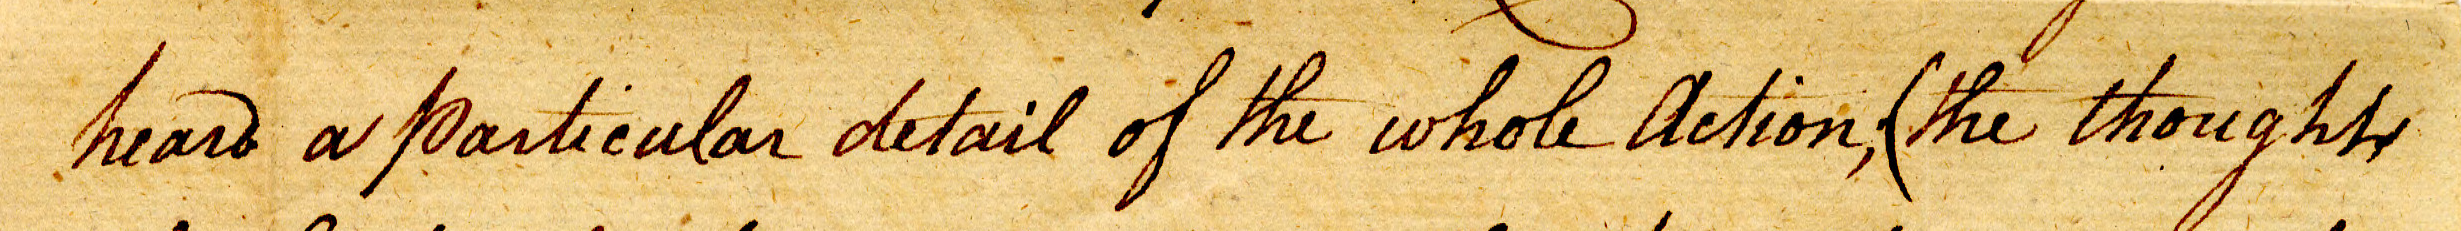heard a particular detail of the whole Action; (the thoughts
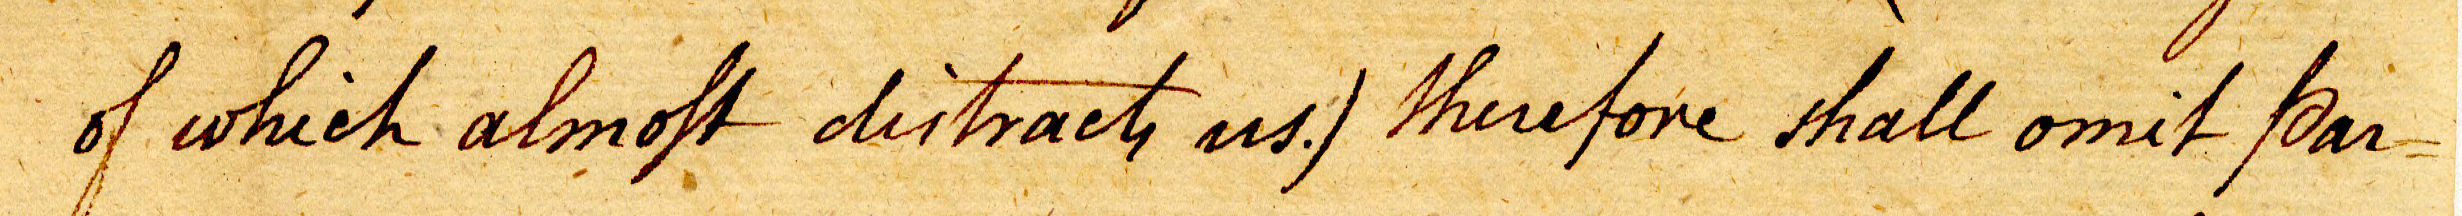of which almost distracts us.) therefore shall omit par-
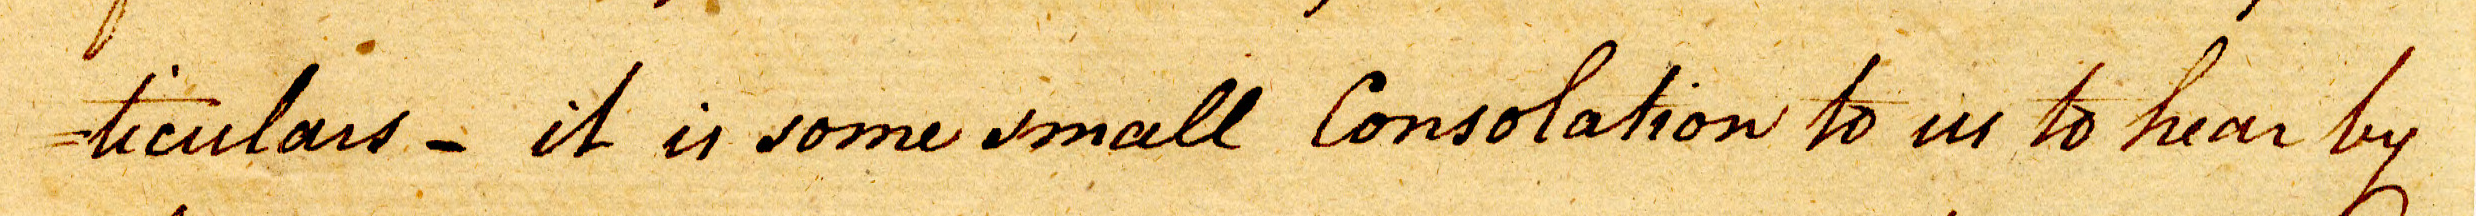-ticulars- it is some small Consolation to us to hear by
